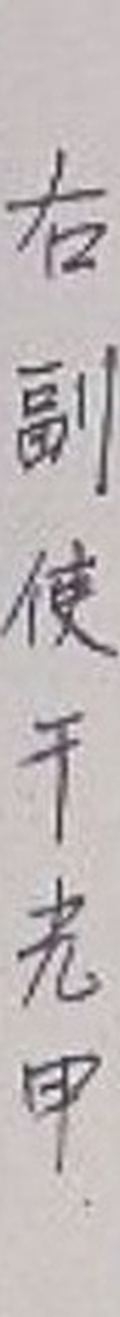右副使干光甲

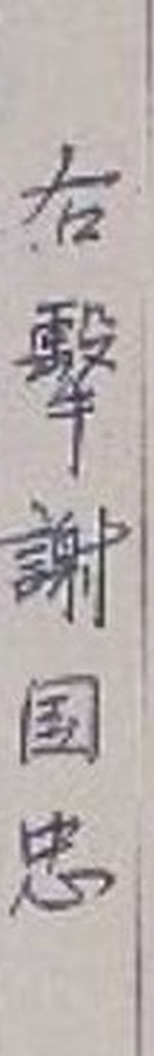右撃謝国忠
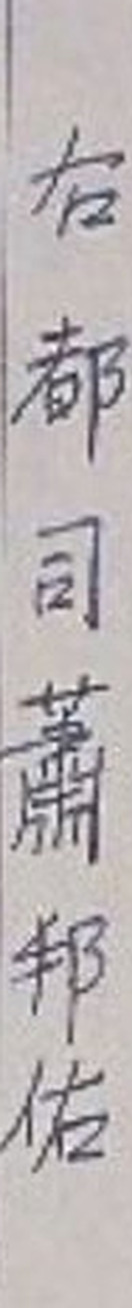右都司蕭邦佑
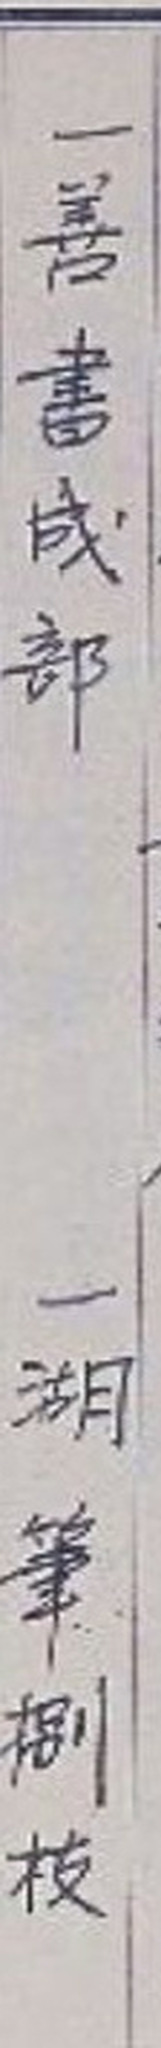一善書成部一湖筆捌枝
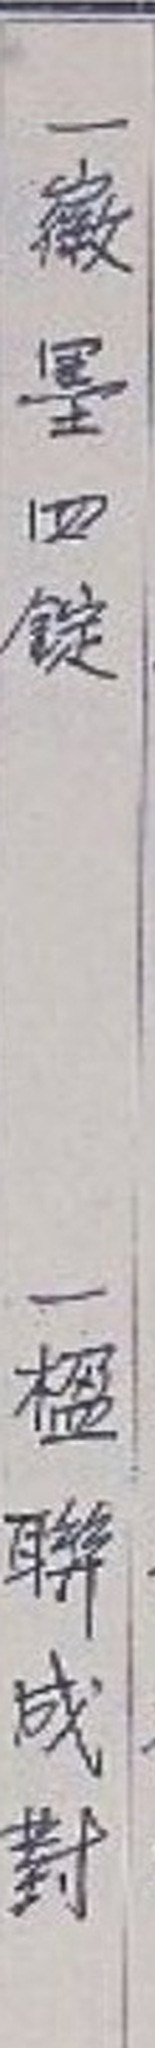一徽墨四錠一楹聯成対
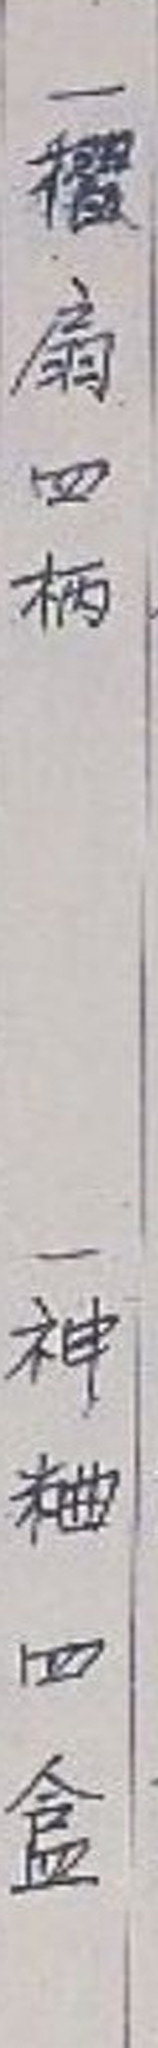一摺扇四柄一神粬四盒
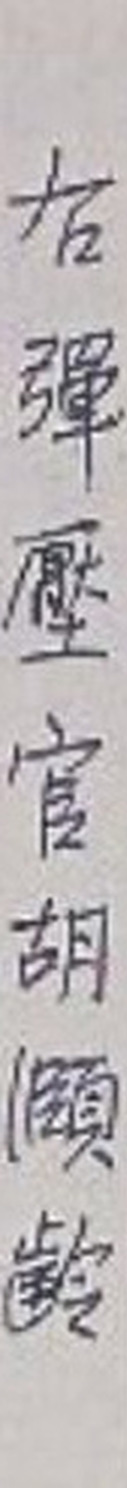右弾圧官胡頥齢
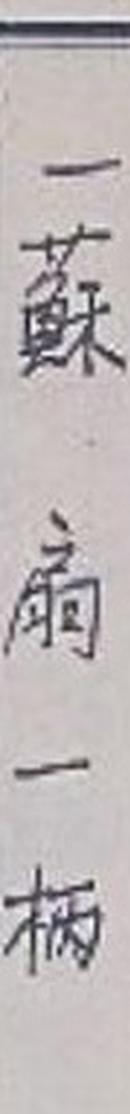一蘇扇一柄一聯対一付
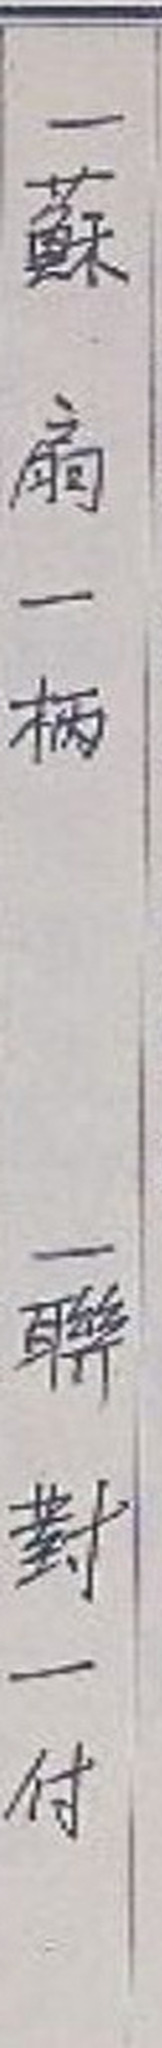一蘇扇一柄一聯対一付
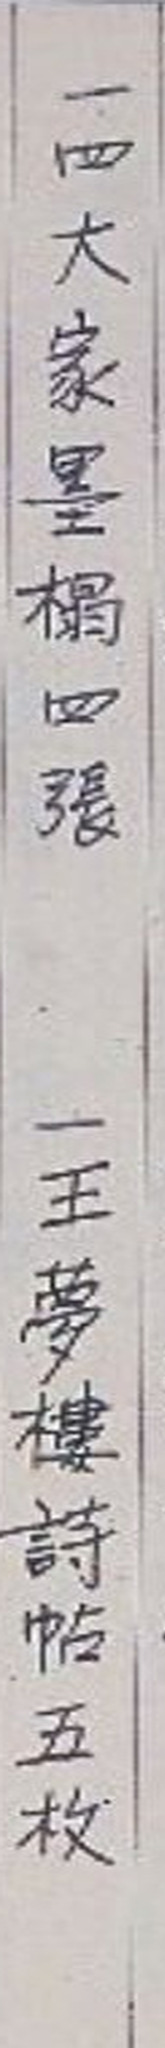一四大家墨榻四張一王夢楼詩帖五枚
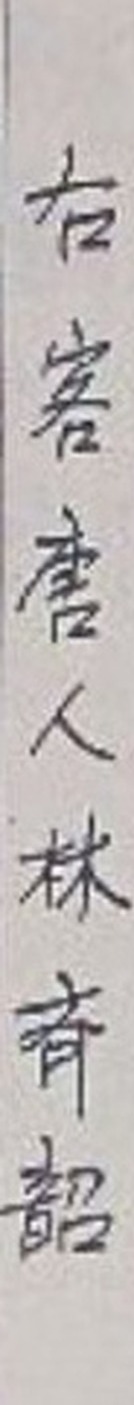右客唐人林齊韶
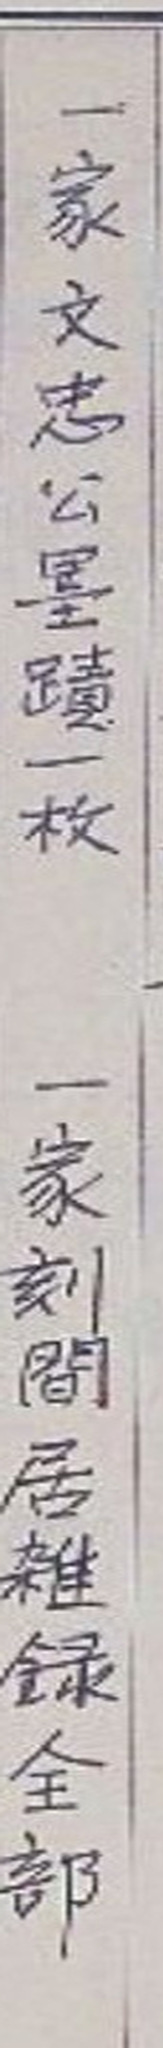一家文忠公墨蹟一枚一家刻間居雑録全部
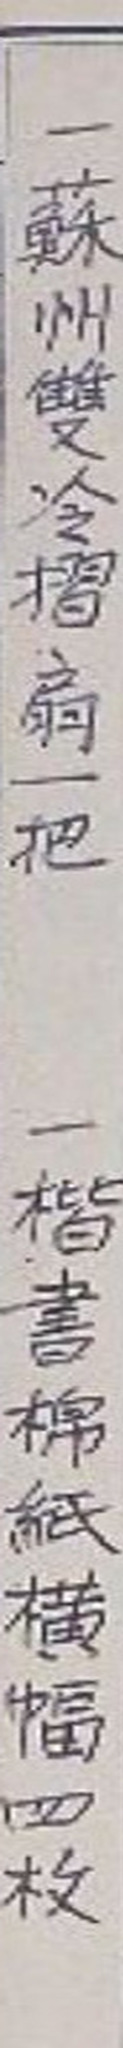一蘇州雙冷摺扇一把一楷書棉紙横幅四枚
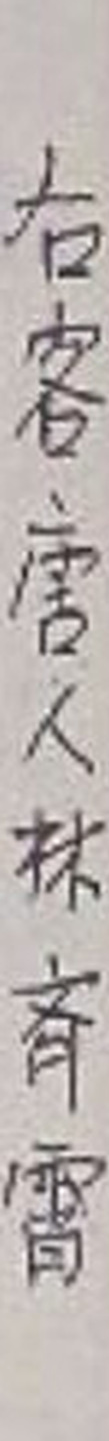右客唐人林齊韶
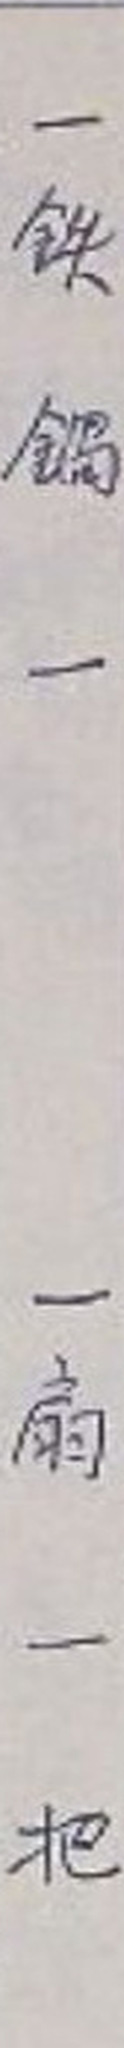一鉄鍋一一扇一把
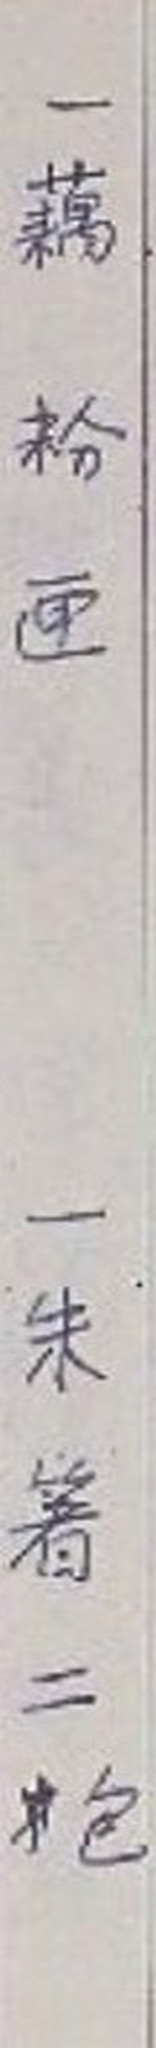一藕粉匣一朱箸二枹
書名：支那冊封使来琉諸記 下巻
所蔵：University of the Ryukyus Library
